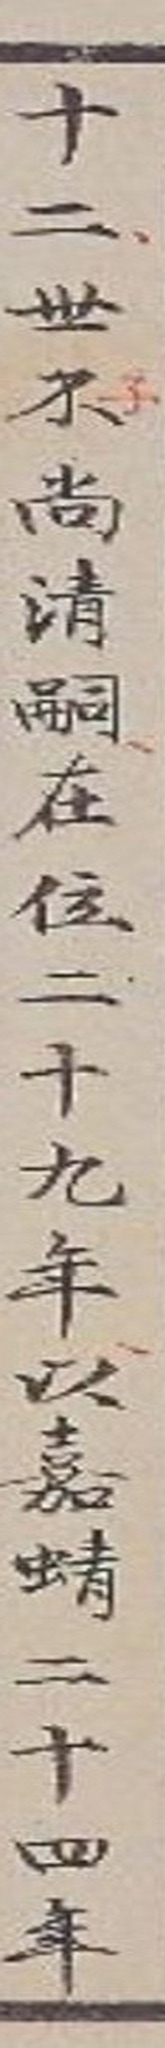十二、世不子尚清嗣、在位二十九年、以嘉蜻二十四年
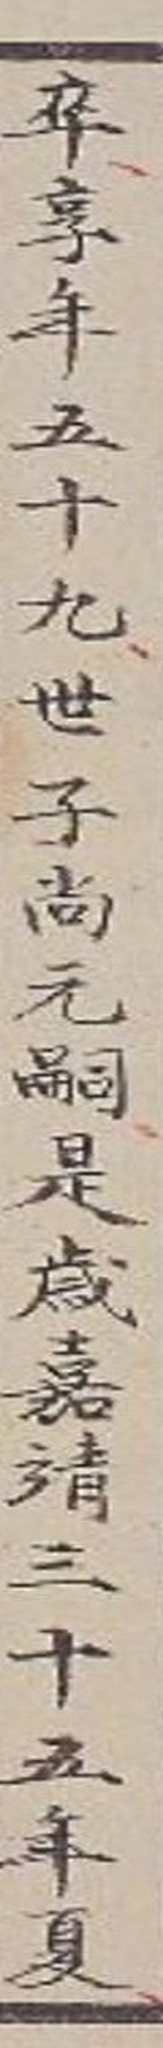卒、享年五十九、世子尚元嗣、是歳嘉靖三十五年夏、
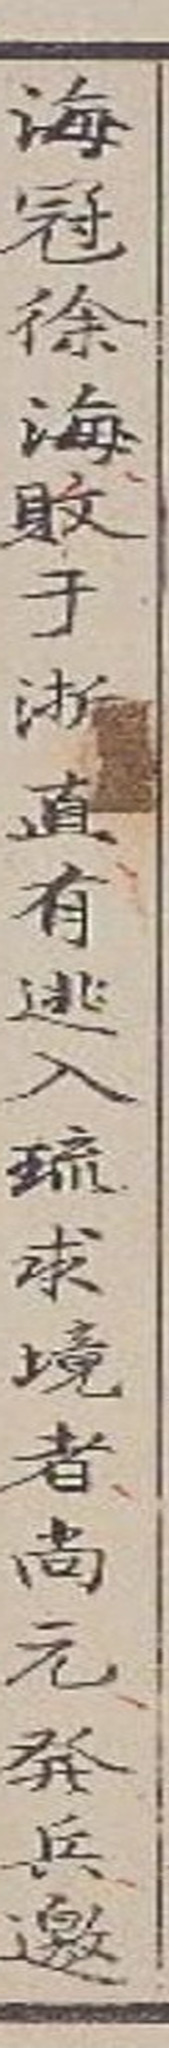海寇徐海敗于浙直、有逃入琉求境者、尚元、発兵、邀
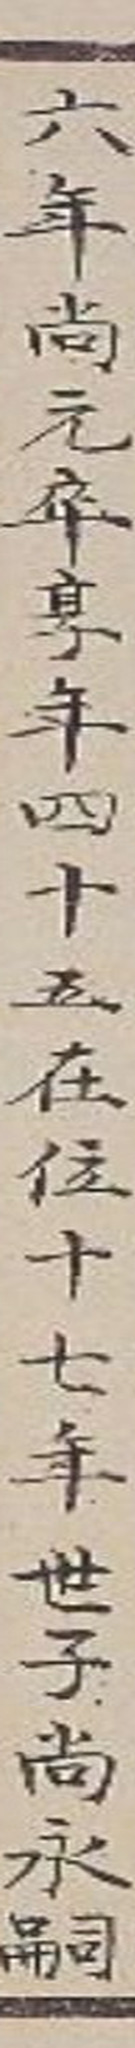六年尚元卒享年四十五在位十七年世子尚永嗣
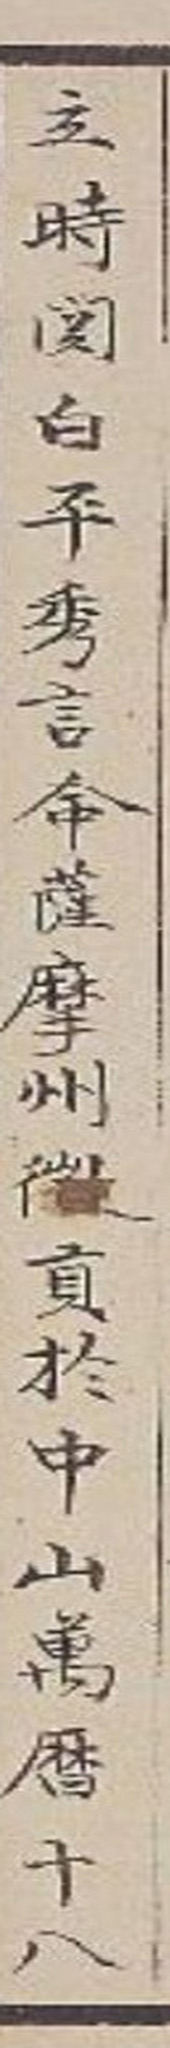立時関白平秀言命薩摩州徵貢於中山万暦十八
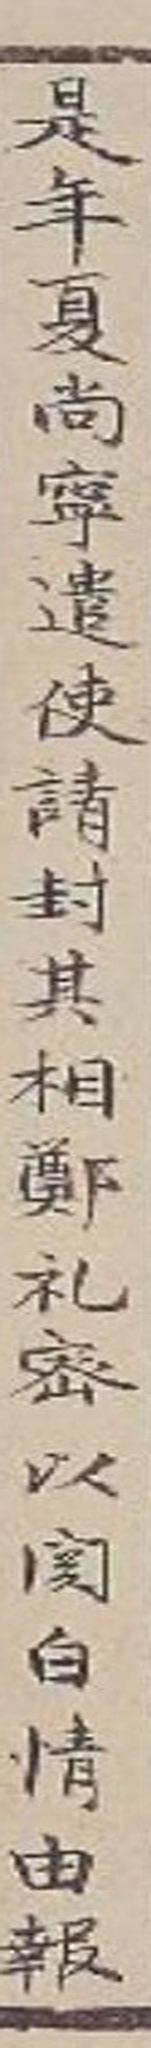是年夏尚寧遣使請封其相鄭礼密以関白情由報
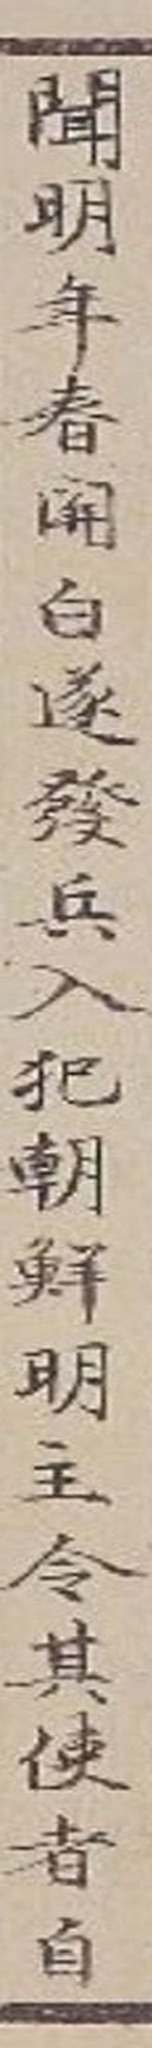聞明年春関白遂発兵入犯朝鮮明主令其使者自
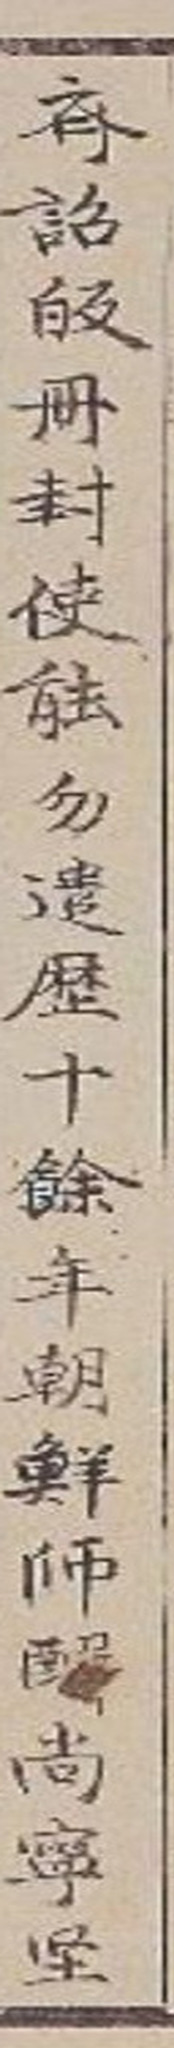斉詔帰冊封使能勿遣暦十余年朝鮮師尚寧堅
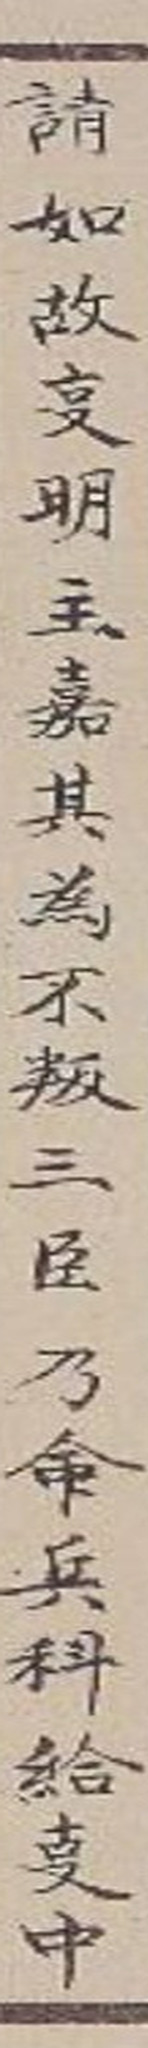請如故事明主嘉其為不叛三臣乃命兵科給事中
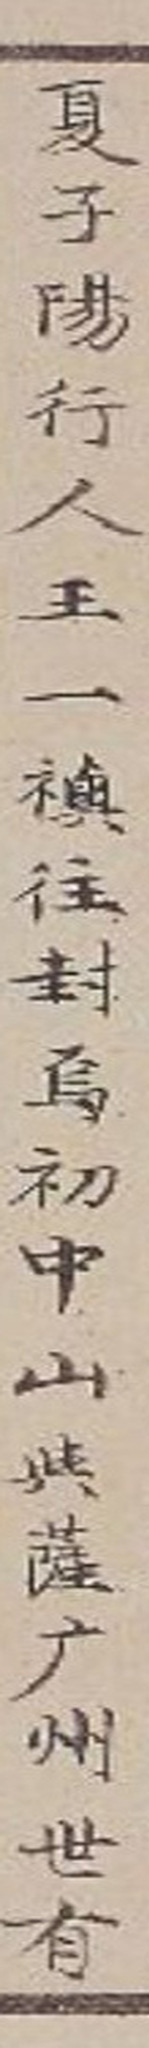夏子陽行人王一襖往封焉初中山与薩摩州世有
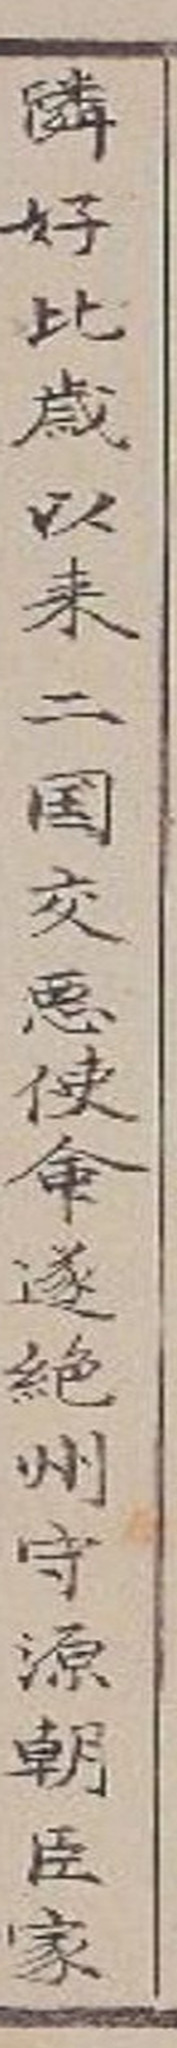隣好此歳以来二国交悪使命遂絶州守源朝臣家
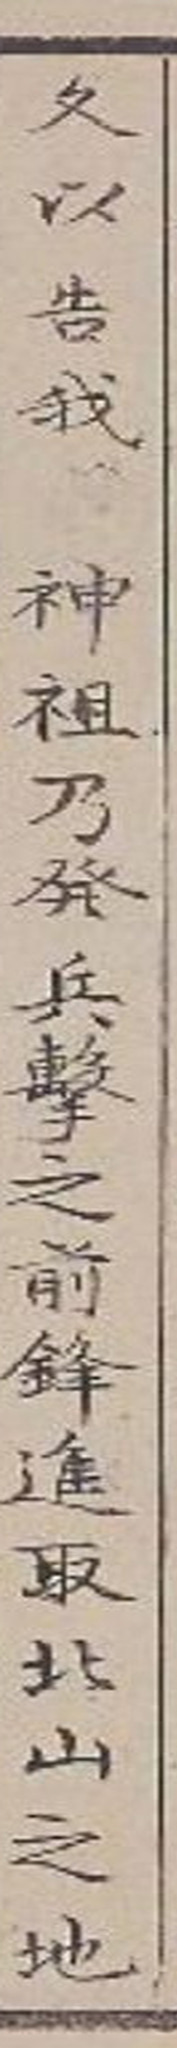久以告我神祖乃発兵撃之前鋒進取北山之地

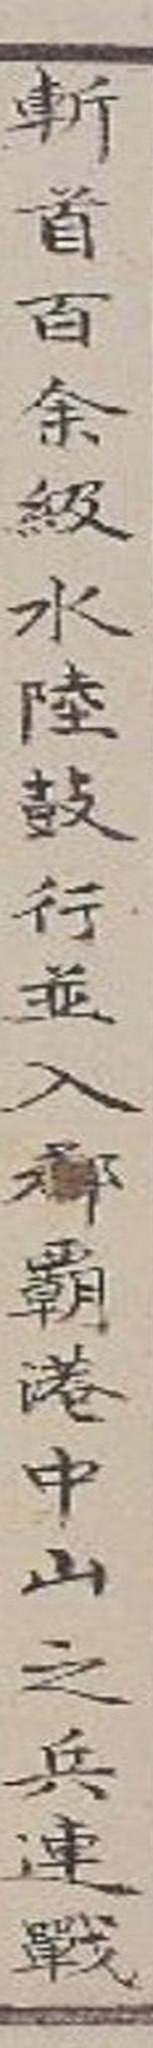斬首百余級水陸鼓行並入那覇港中山之兵連戦
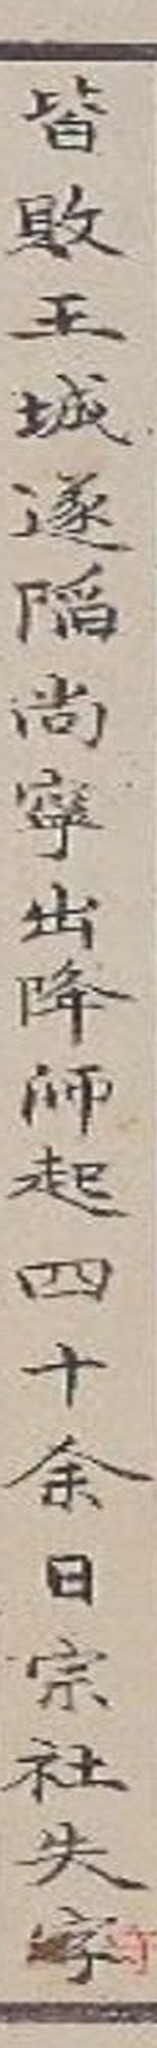皆敗王城遂陥尚寧出降師起四十余日宗社失字守
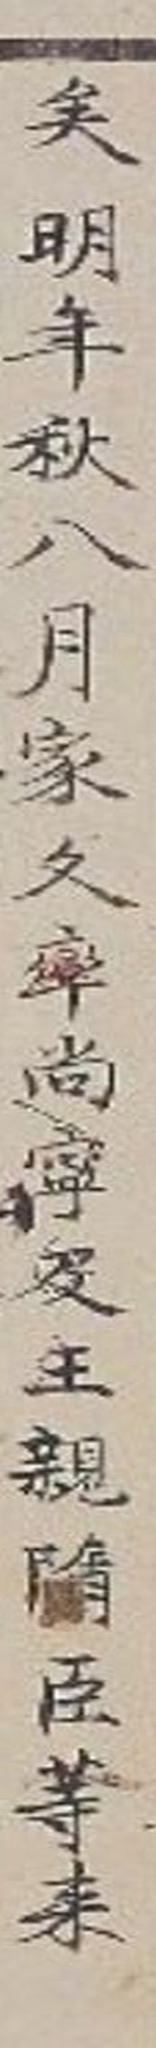矣明年秋八月家久率尚寧及王親随臣等来
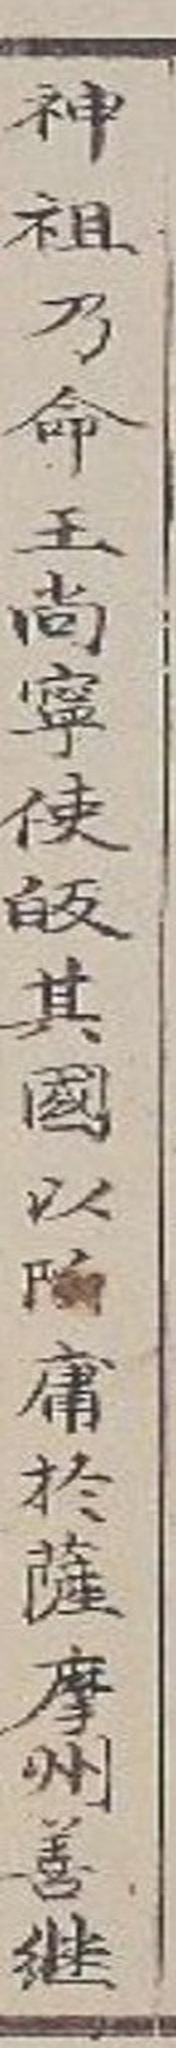神祖乃命王尚寧使帰其国以庸於薩摩州善継
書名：南島志 全
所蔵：University of the Ryukyus Library
